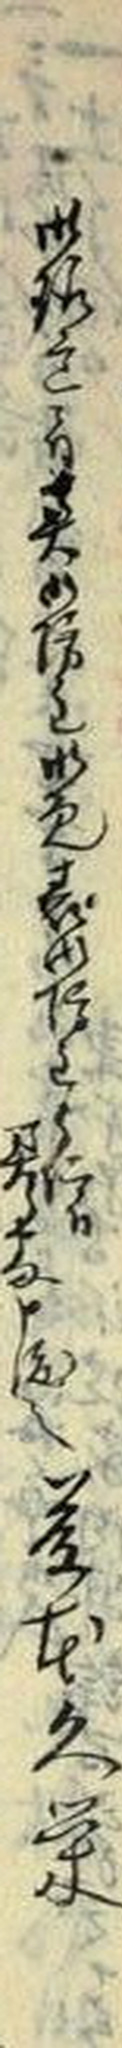御趣意ニ付奥御坊主御免表御坊主被仰付奥之番申渡之藤本久栄
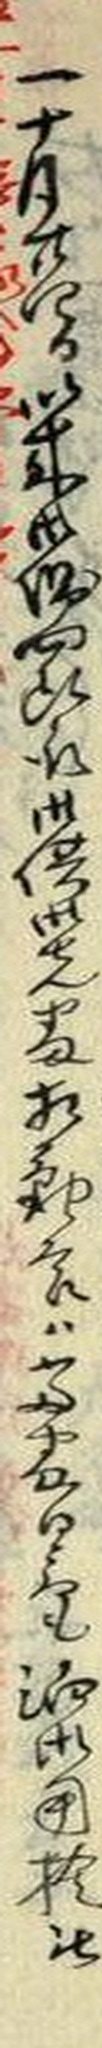一十月廿四日以来御側向頭取御供御先番相勤候節ハ当番日ニ而も泊御用捨被
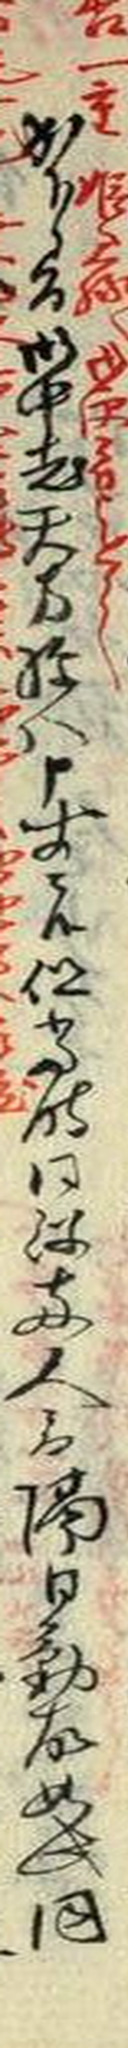成下候旨御中老天方孫八申聞ニ候但当時同役両人ニ而隔日勤故如此同
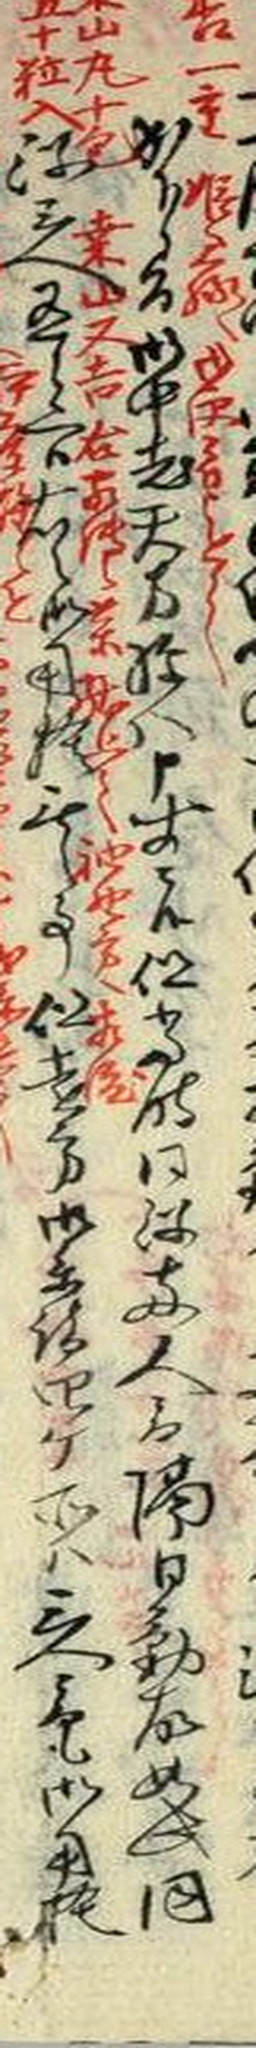役三人有之候ヘハ右之御用捨無之事但遠方御参詣四ケ所ハ三人ニ而も御用捨
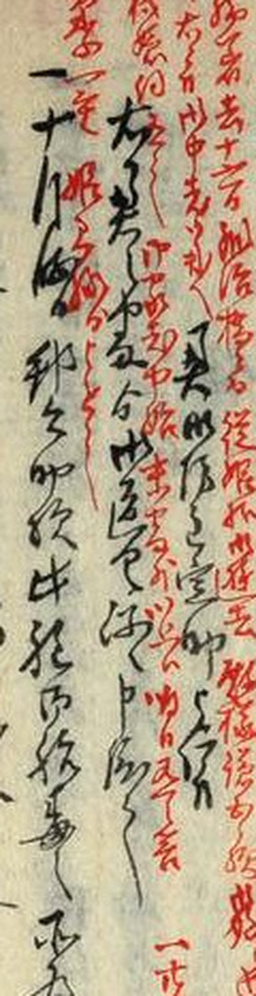右奥之番ゟ御道具役へ申渡之
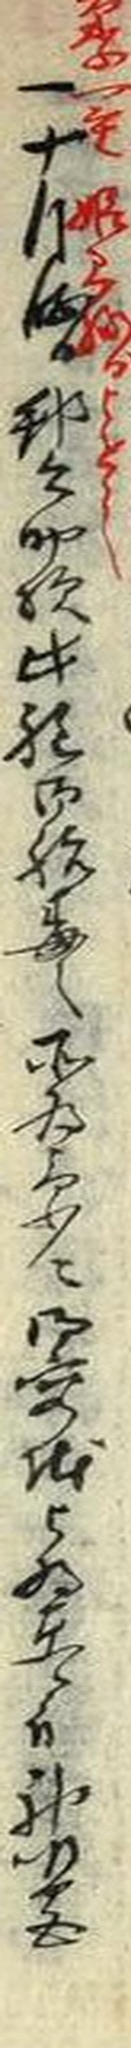一十月晦日邦之助様此程御胎毒之所為ニ而少々御容体為在候ニ付神明宮
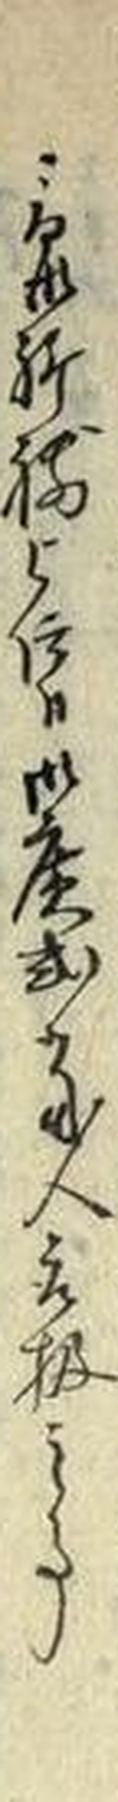ニ而御祈禱被仰付御広式御用人取扱之候事
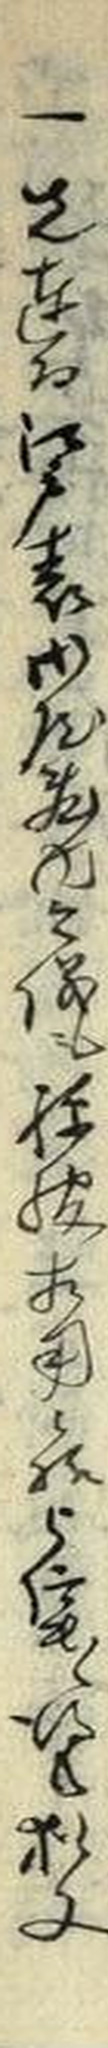一先達而江戸表御屋敷内之儀も綿服相用候様被仰出候得共猶又
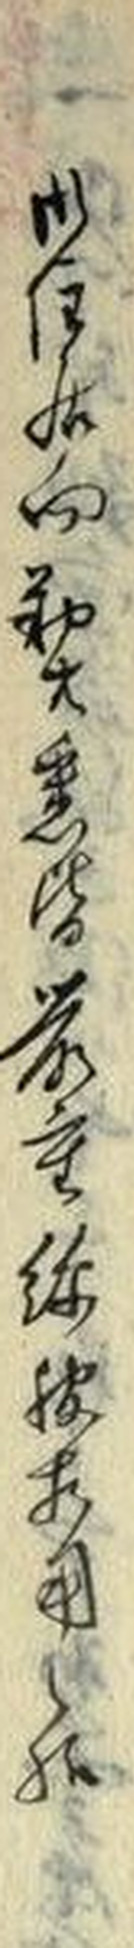御住居向勤者悉皆厳重綿服相用候様

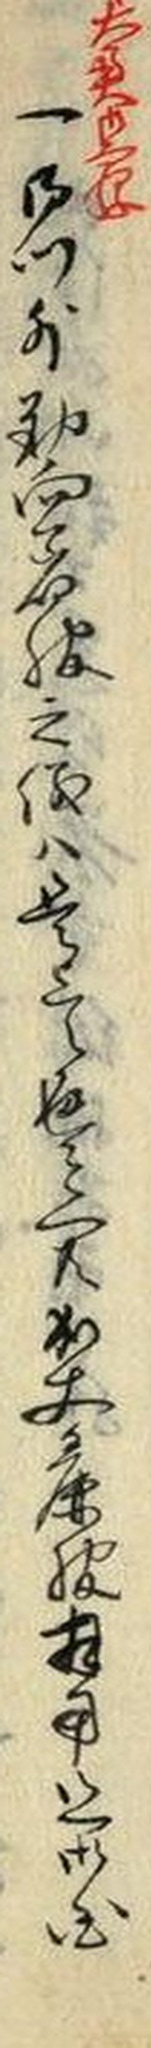一御門外勤向着服之儀ハ是迄之通ニ候へ共成丈麁服相用且御国
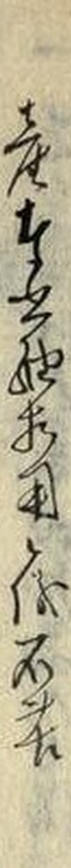産奉書紬相用候儀不苦
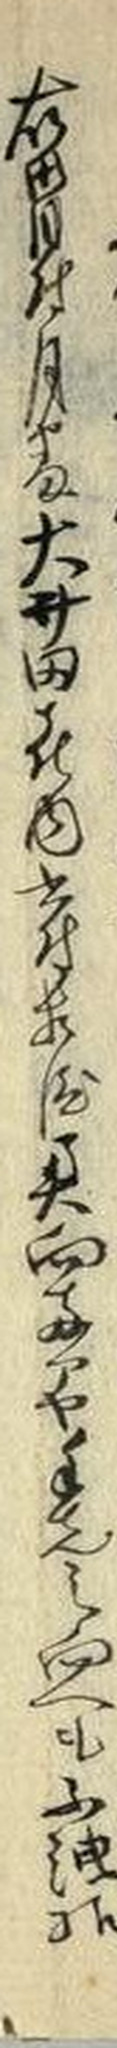右御目付月番大井田喜内書付相渡奥向両部や手先之向へも不洩様
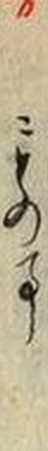ニとの事
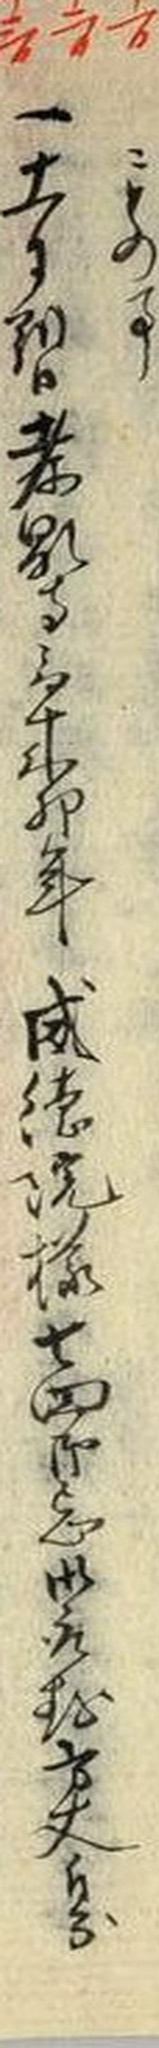一十一月朔日孝顕寺ニ而来卯年威徳院様七回御忌御取越方丈自分
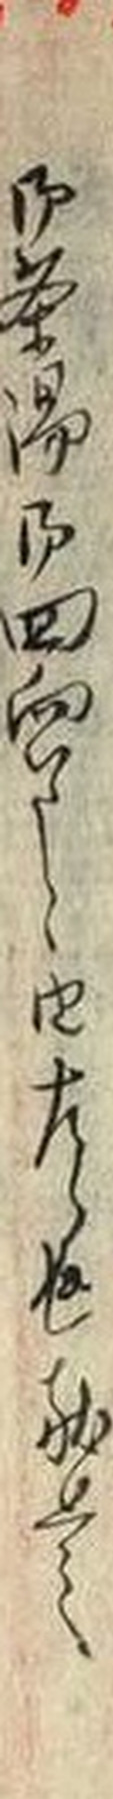御茶湯御回向いたし候由左之通献上之
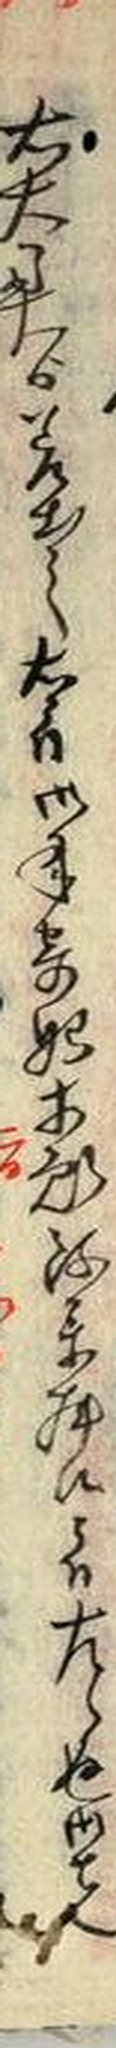右大奥ゟ差出之右ニ付御年寄始相願致参拝候ニ付左之通御先
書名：少傅日録抄（斉承付側向頭取日記、在国）
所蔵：福井県文書館 Fukui Prefectural Archives
